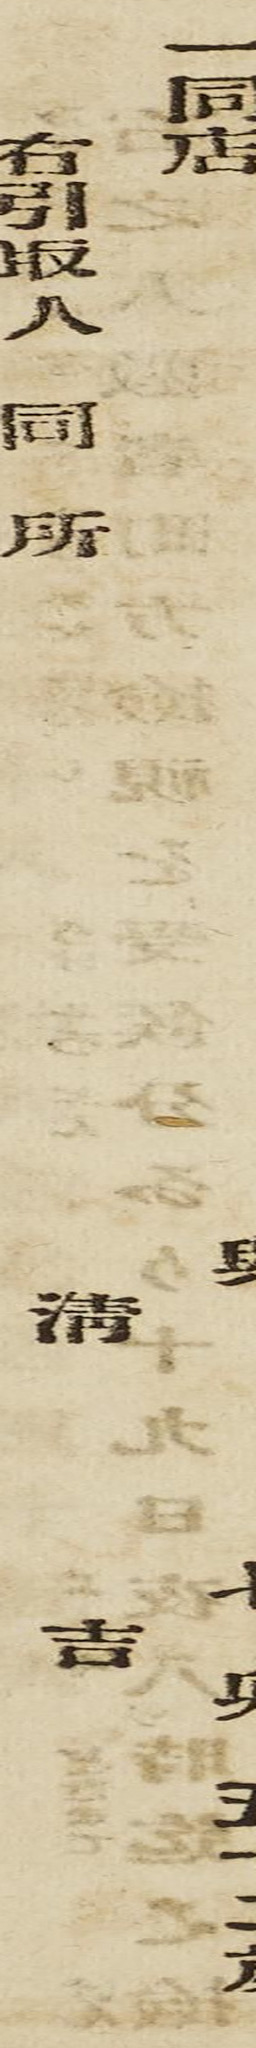右引取人同所清吉
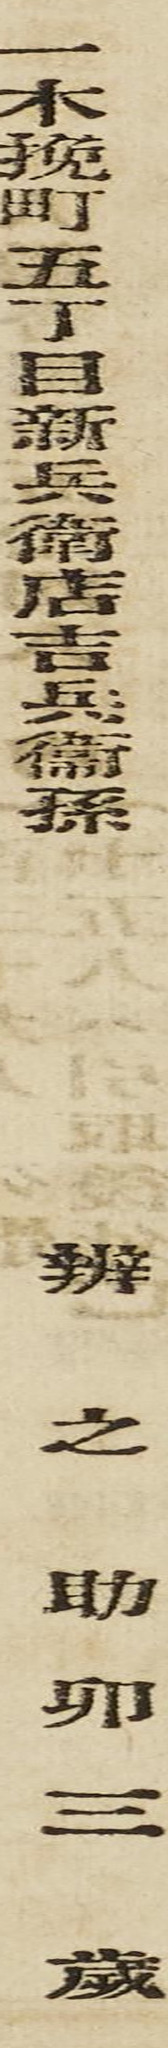一木挽町五丁目新兵衛店吉兵衛孫辨之助卯三歳
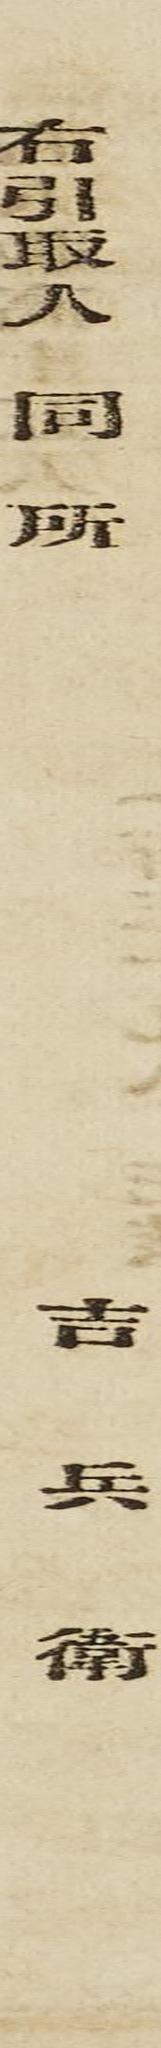右引取人同所吉兵衛
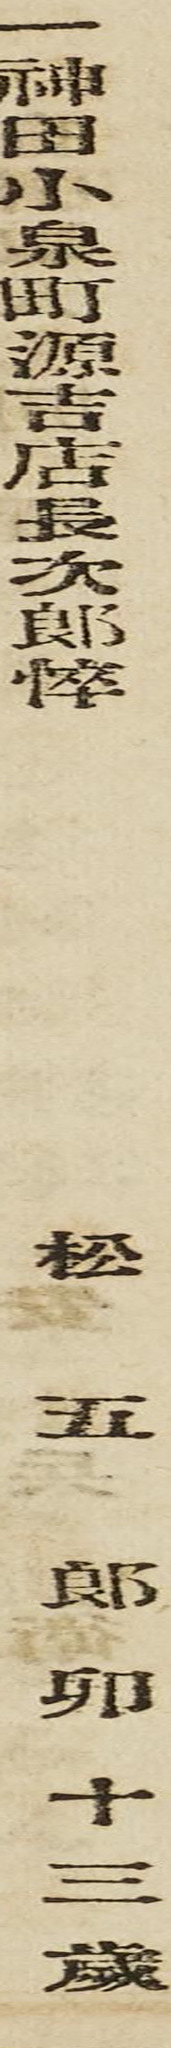一神田小泉町源吉店長次郎倅松五郎卯十三歳
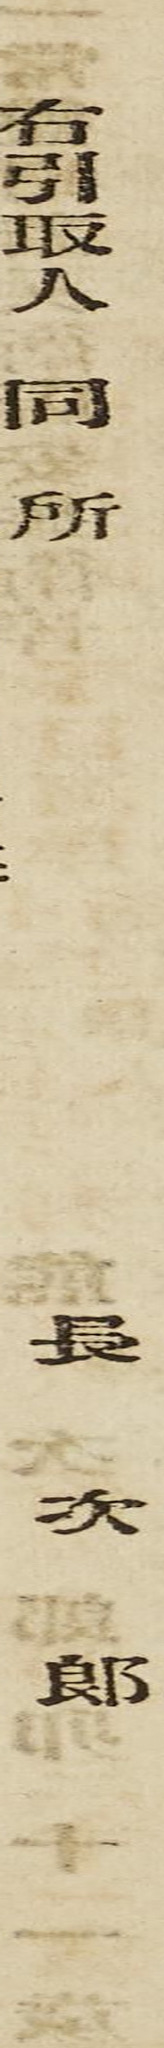右引取人同所長次郎
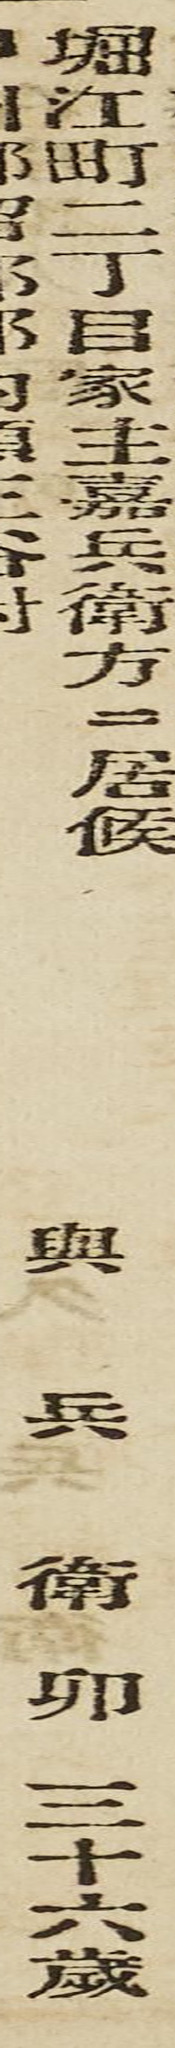一堀江町二丁目家主嘉兵衛方ニ居候與兵衛卯三十六歳
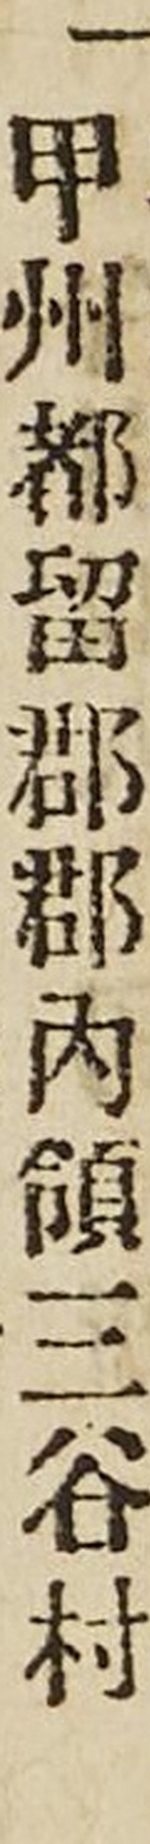甲州都留郡郡内領三谷村
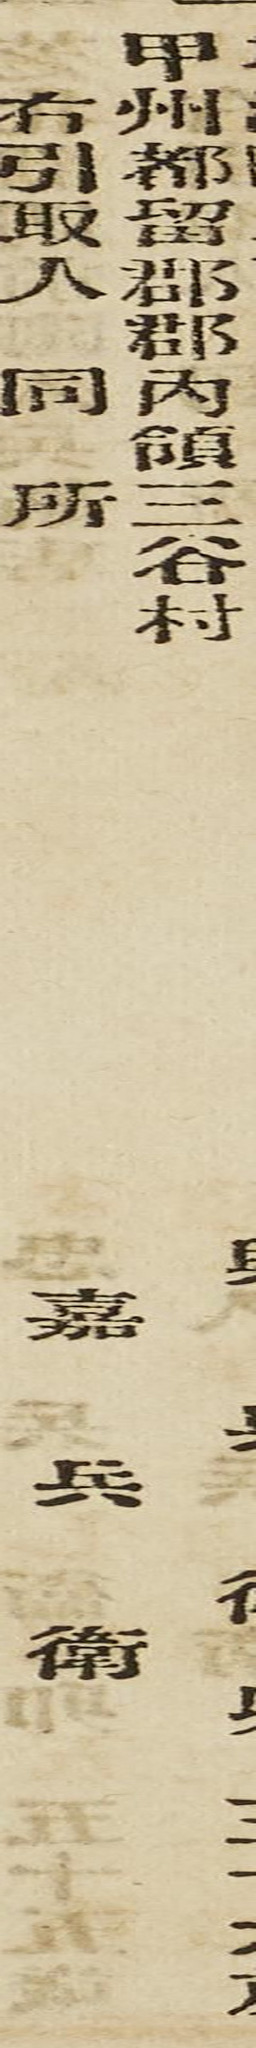右引取人同所嘉兵衛
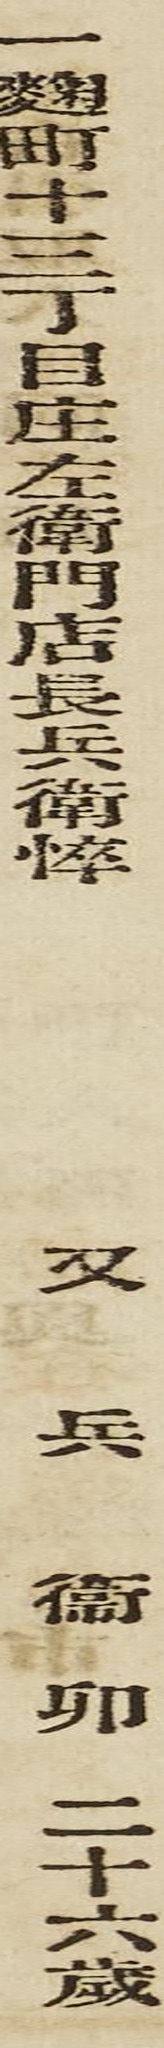一麹町十三丁目庄左エ門店長兵衛倅又兵衛卯二十六歳
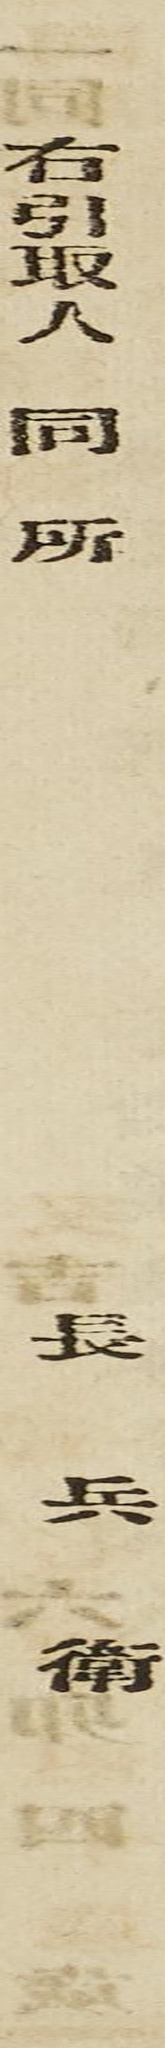右引取人同所長兵衛
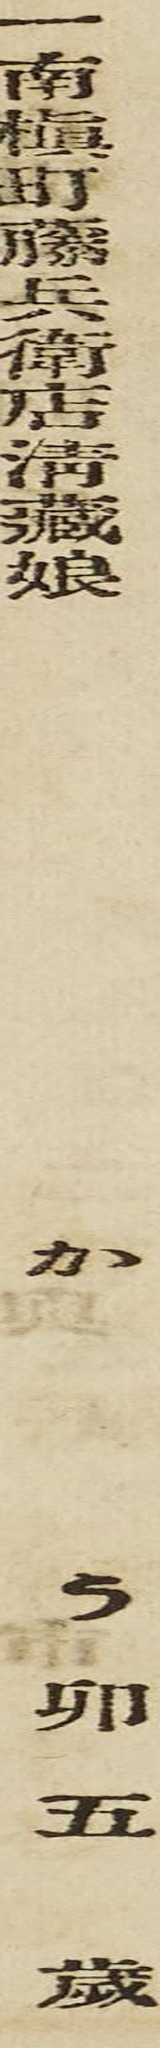一南槇町藤兵衛店清蔵娘かう卯五歳
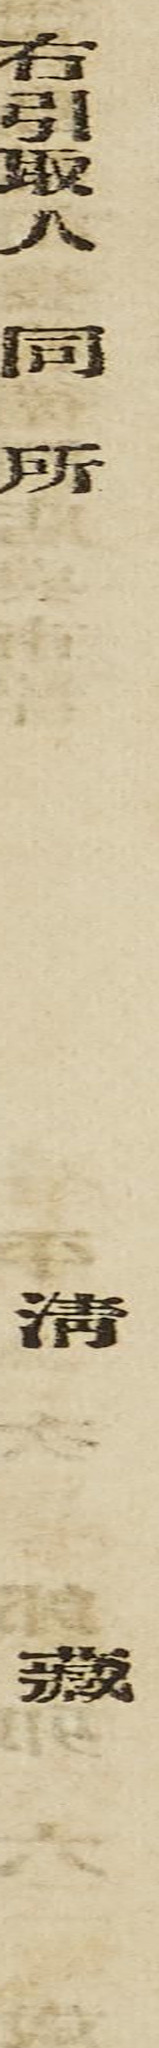右引取人同所清吉

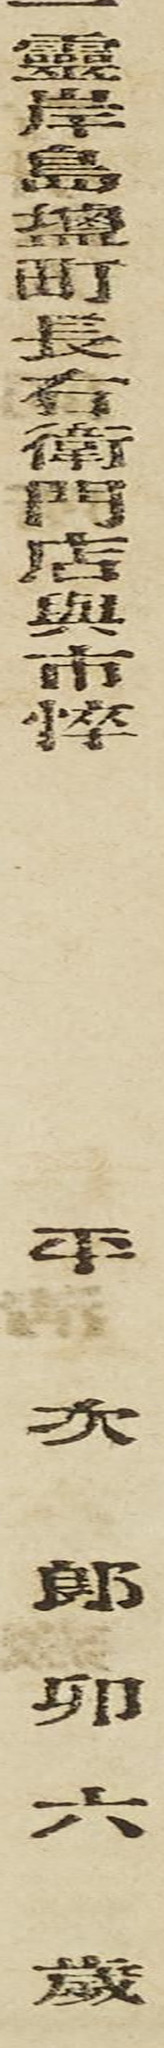一霊岸島鹽町長右衛門店與市倅平次郎卯六歳
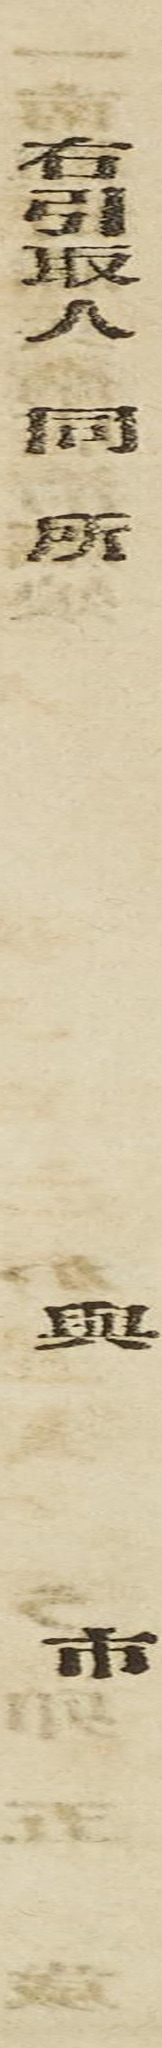右引取人同所與市
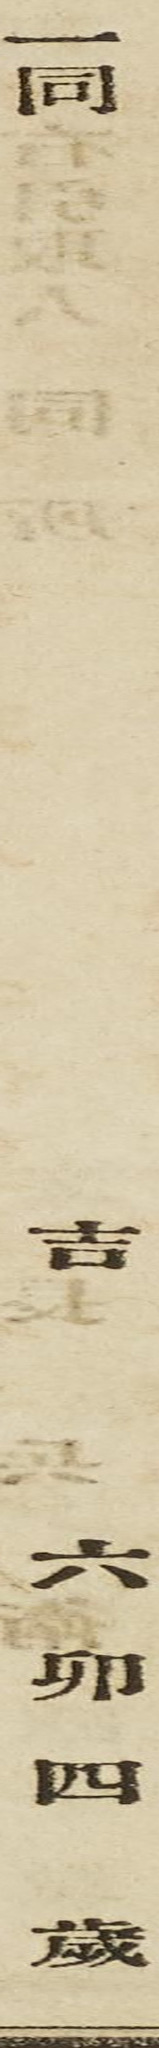一同吉六卯四歳
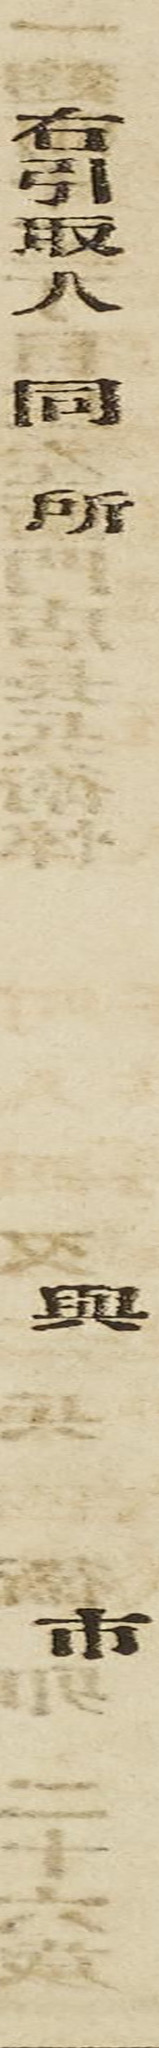右引取人同所與市
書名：永代惨話　文化の夢　全
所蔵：東京大学地震研究所図書室 Earthquake Research Institute Library, The University of Tokyo, JAPAN
